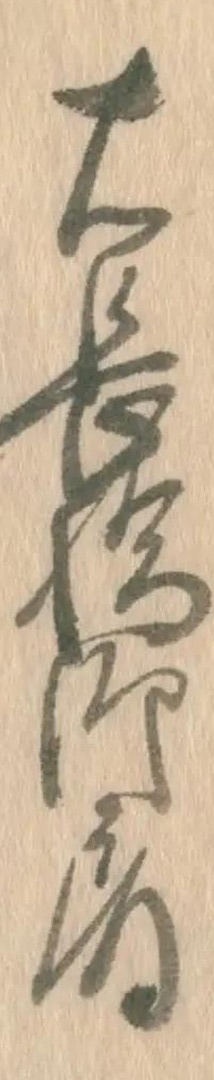右長橋御局
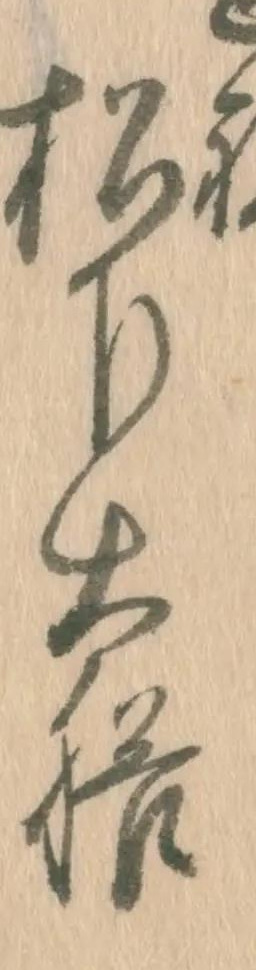松下大膳
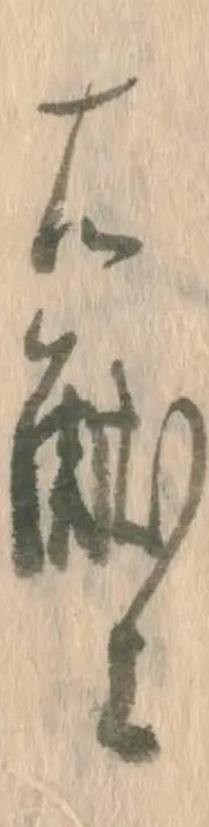右献上
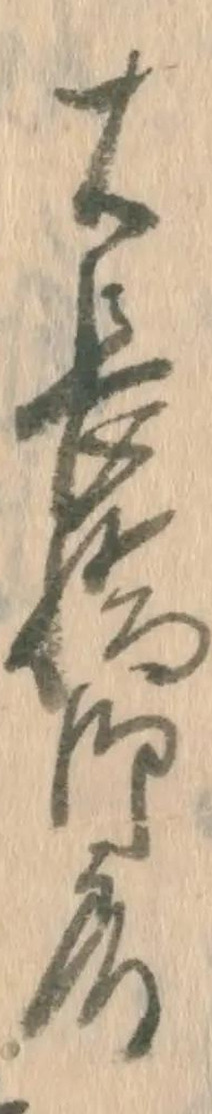右長橋御局
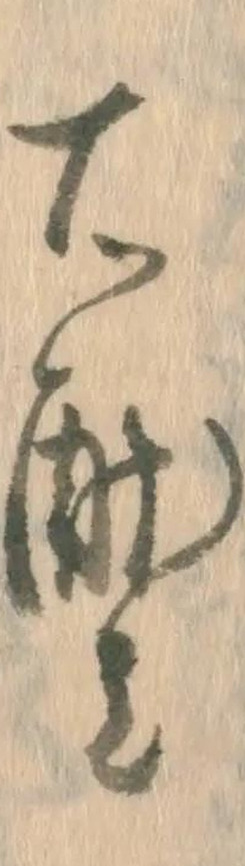右献上
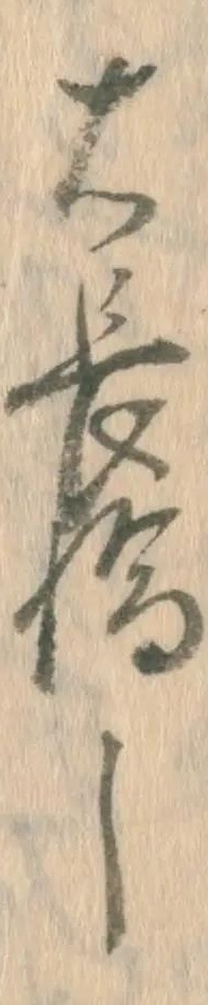右長橋同
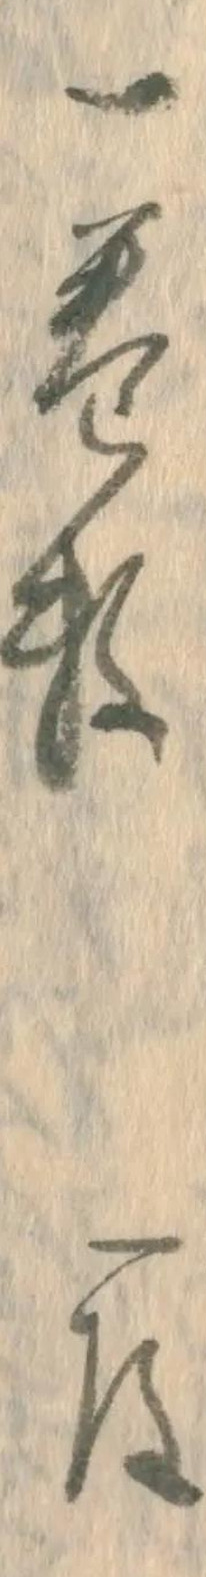一巻数一枝
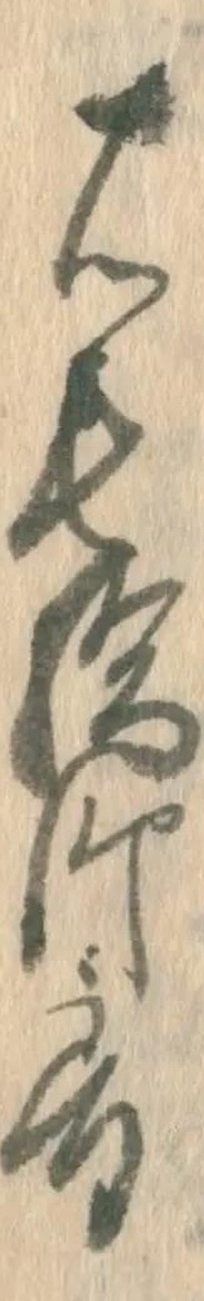右長橋御局
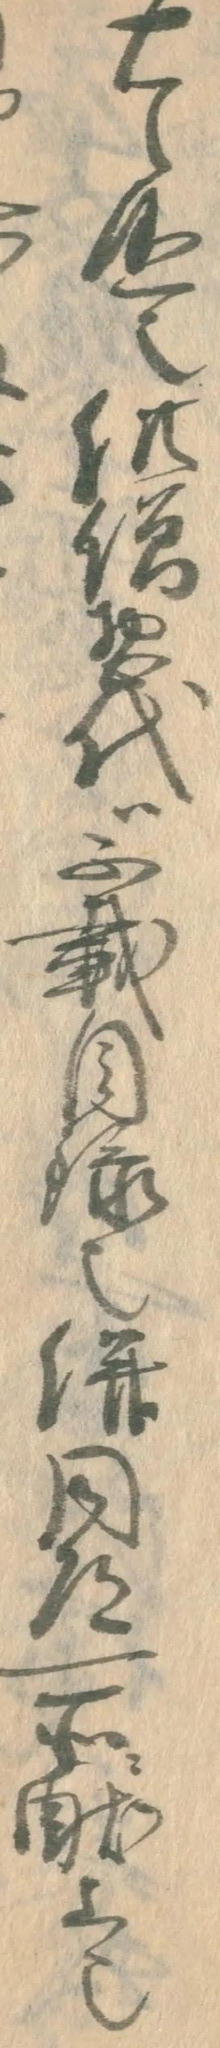右之通也供僧惣代ハ不載目録也併同道一所ニ献上也
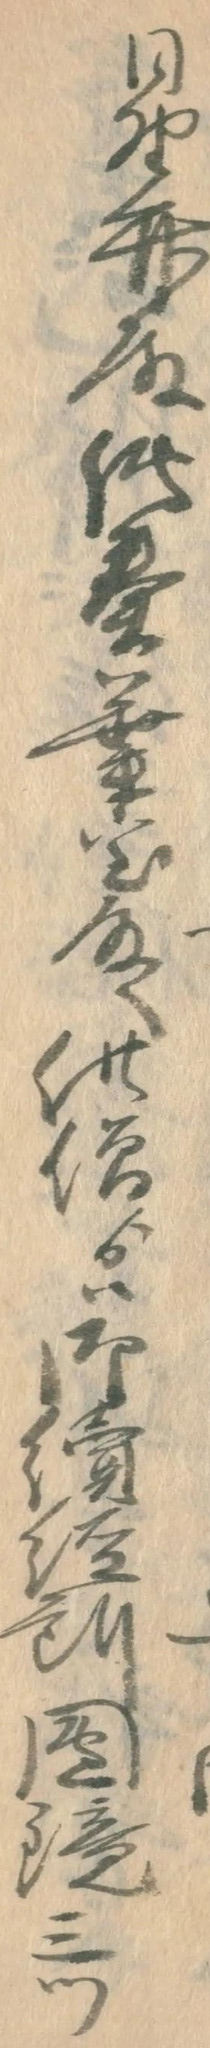日野弁殿伝奏葉室殿へ供僧ゟハ御続経所団鏡三ツ

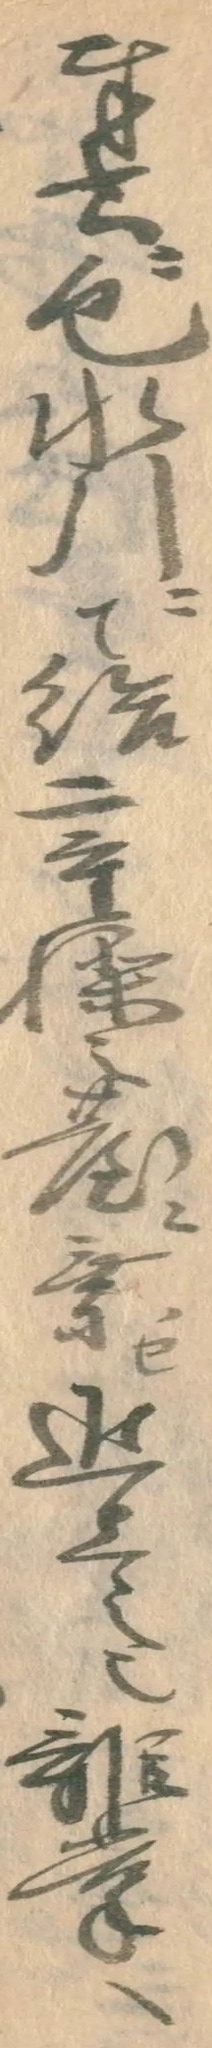奉書ニ包水引ニて結二重操之台ニ乗セ進上之也雑掌へ
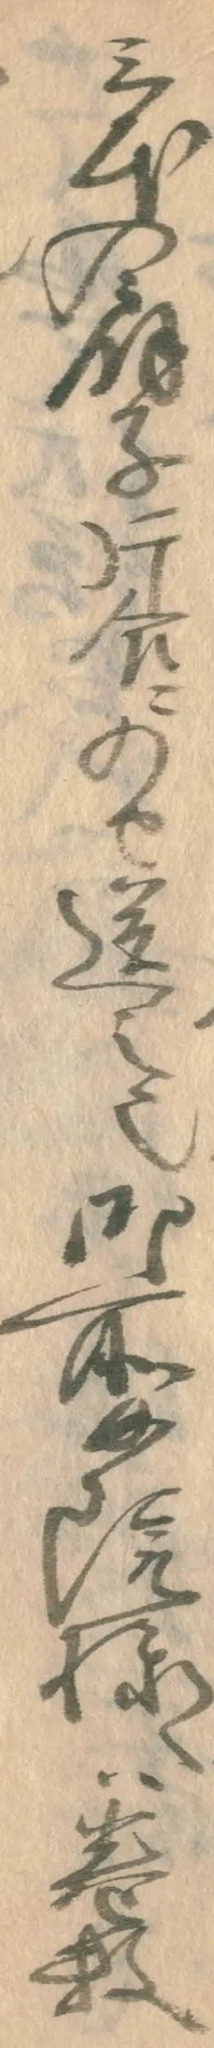三本入扇子片合ニのせ送之也御所女院様へハ巻数
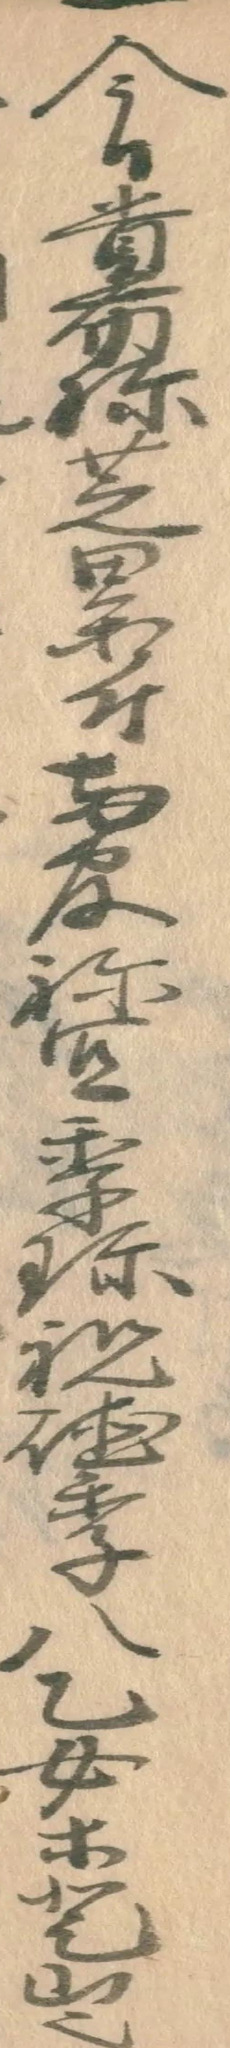一今日貴布祢芝田楽ニ付両官称宜季珎祝徳季八乙女等登山也
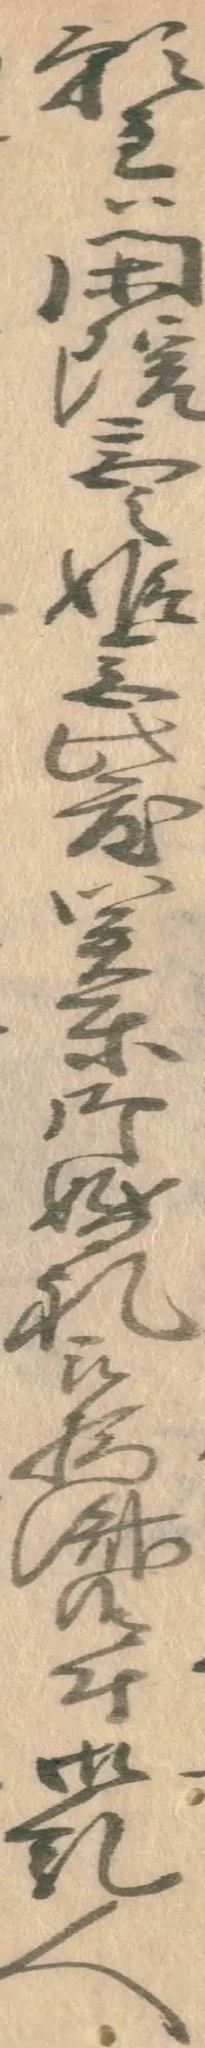願主ハ閑院宮之姫宮此度関東御婚礼被為済候ニ付御乳人
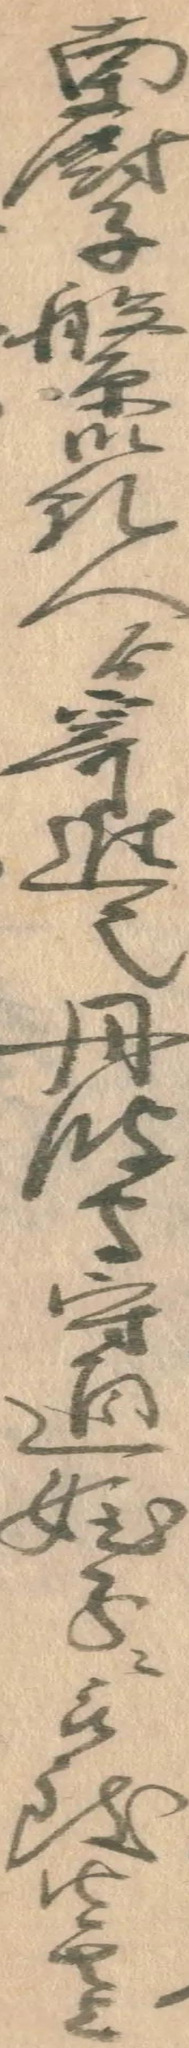南厨子般原御乳人ゟ寄進也丹波守守通姪子ニ被致由其上
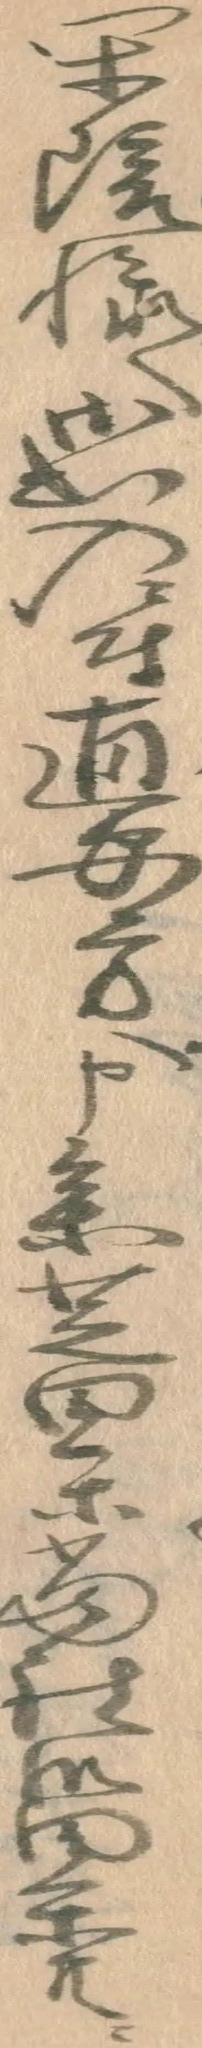閑院様へ御出入ニ付直安方へ申参芝田楽当社御田楽共ニ
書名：賀茂社記録. 第60冊
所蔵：国立国会図書館 National Diet Library, JAPAN
